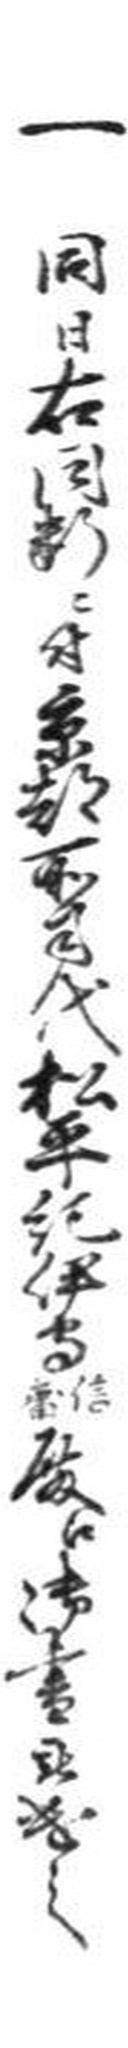一同日右同断ニ付京都所司代松平紀伊守信庸殿江御書被遣之
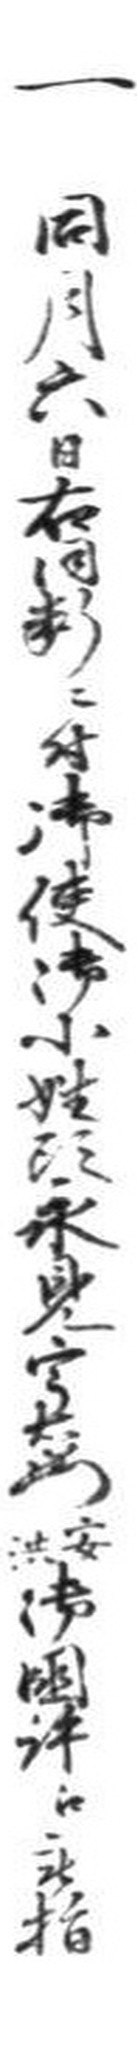一同月六日右同断ニ付御使御小姓頭永見宇右衛門安洪御国許江被指
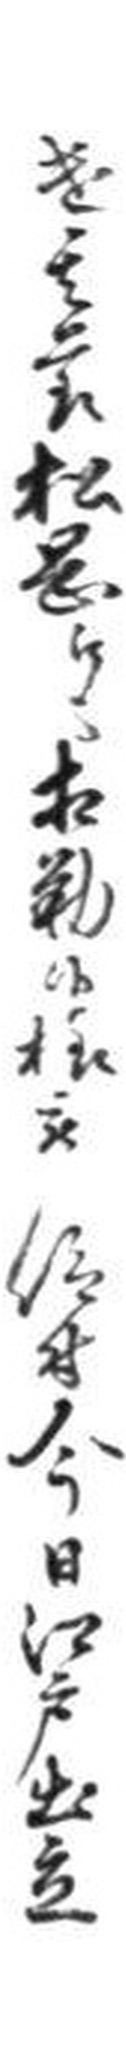遣其節松岡江も相勤候様被仰付今日江戸出立
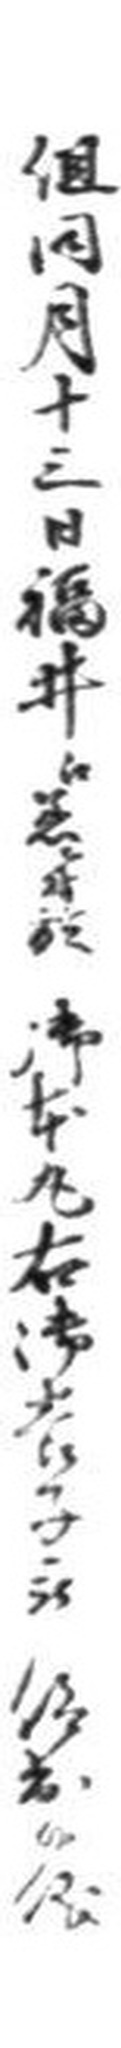但同月十三日福井江着ニ付於御本丸右御養子被仰出候儀
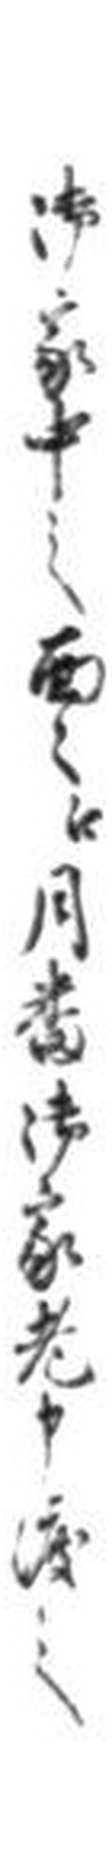御家中之面々江月番御家老申渡之
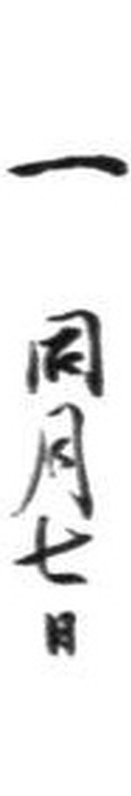一同月七日
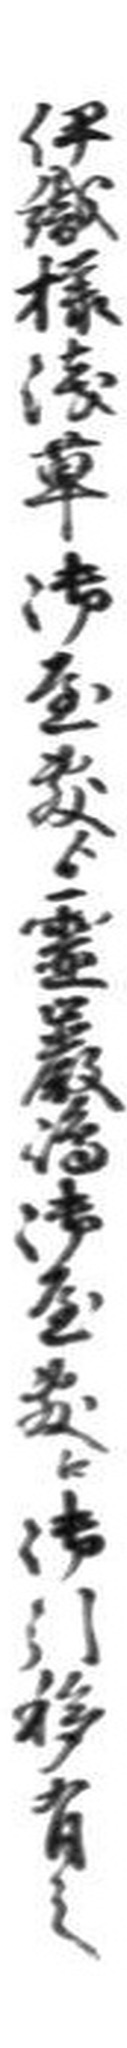伊織様浅草御屋敷ゟ霊雁嶋御屋敷江御引移有之
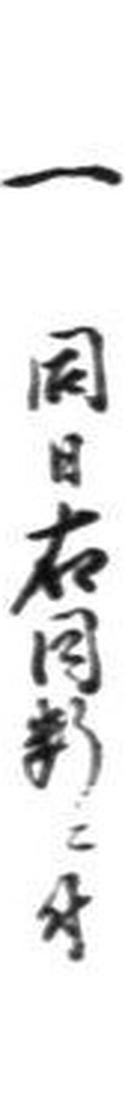一同日右同断ニ付
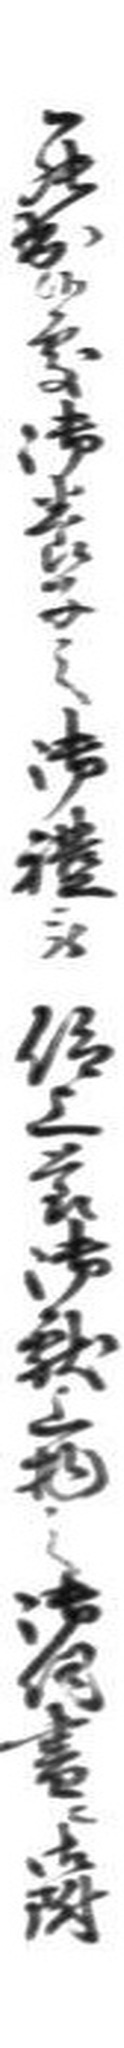罷出候御養子之御礼被仰上節御献上物之御伺書ニ御附
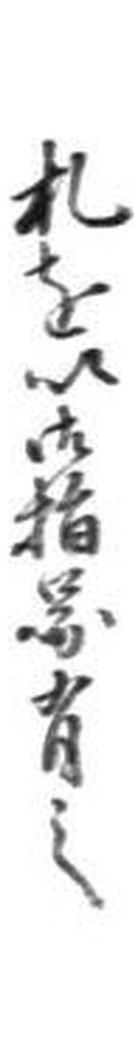札を以御指図有之

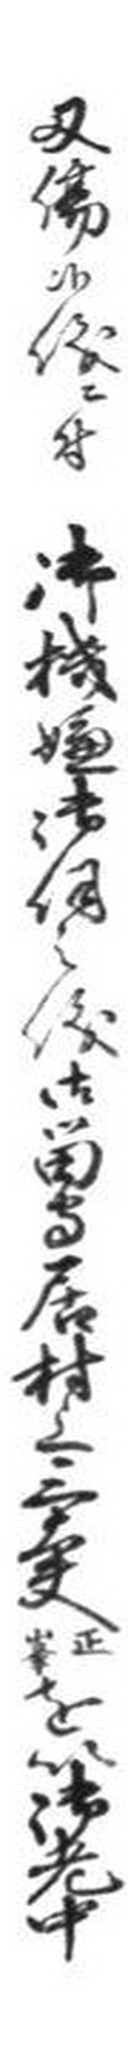刃傷候儀ニ付御機嫌御伺之儀御留守居村上三太夫正峰を以御老中
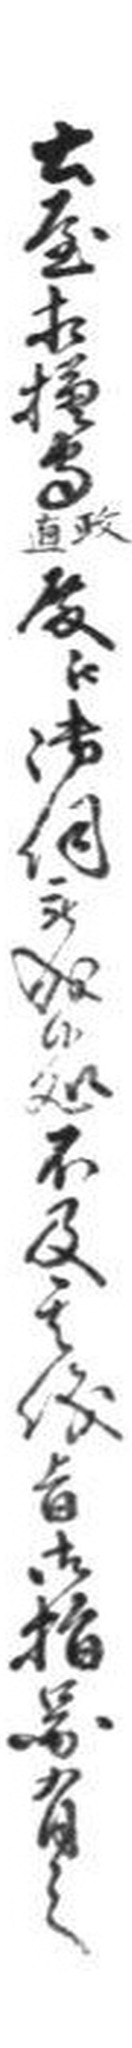土屋相模守政直殿江御伺被成候処不及其儀旨御指図有之
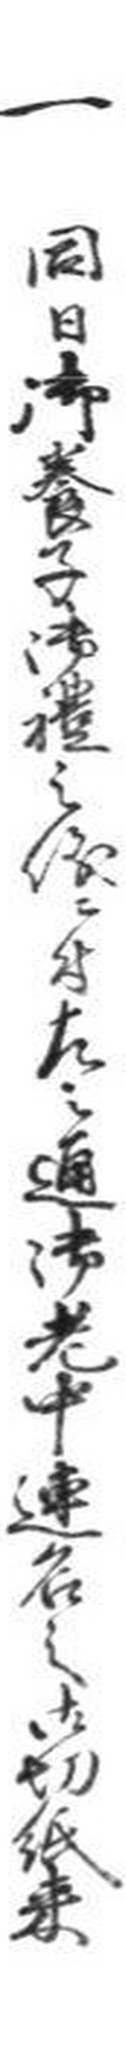一同日御養子御礼之儀ニ付左之通御老中連名之御切紙来
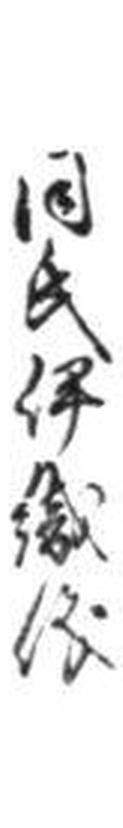同氏伊織儀
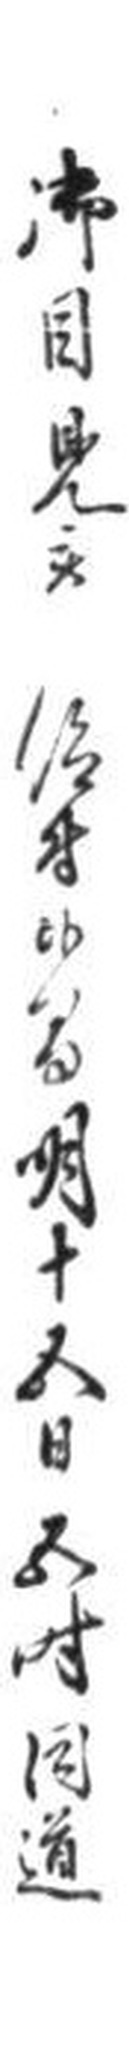御目見被仰付候間明十五日五時同道
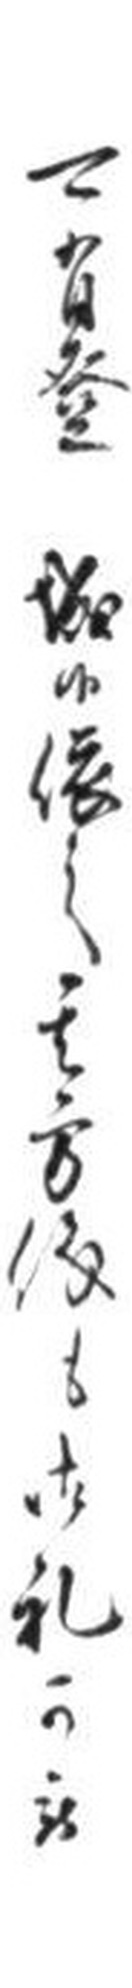可有登城候依之其方儀も御礼可被
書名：家譜 二十一 吉品公 従元禄十三年到同十四年
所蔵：福井県文書館 Fukui Prefectural Archives
